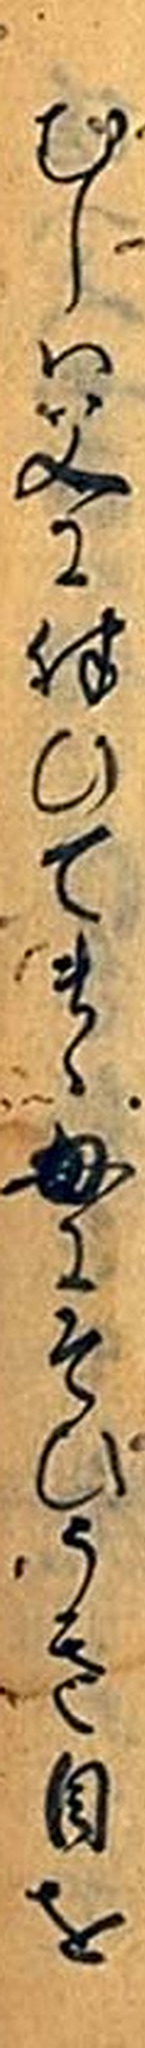むしは父に付ひてまゝ母にそひうき目を

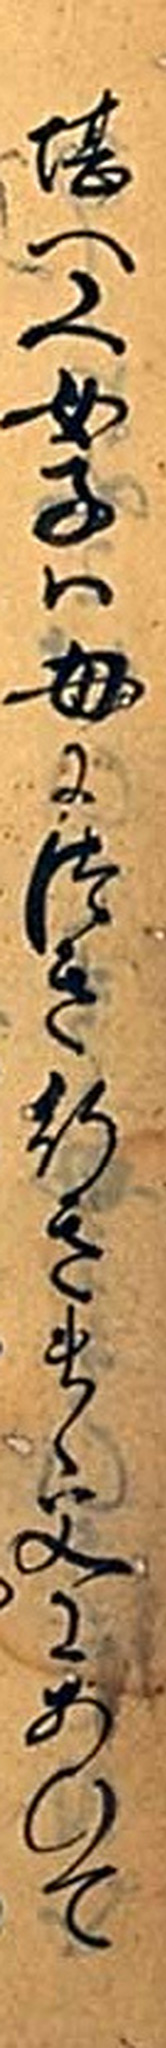堪へ又女子は母につき行きまゝ父にあひて
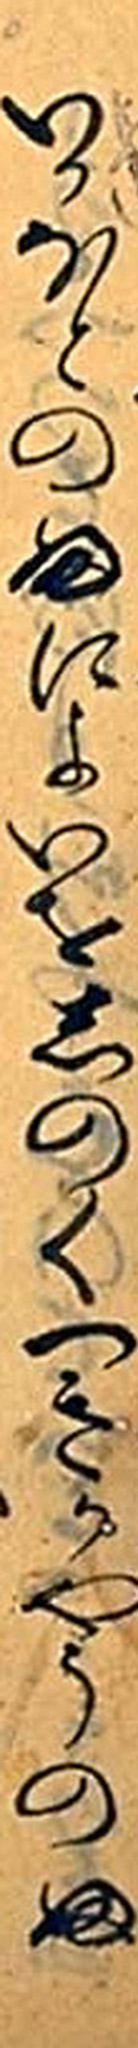いかほとのふによいをしのくへきかやうのふ
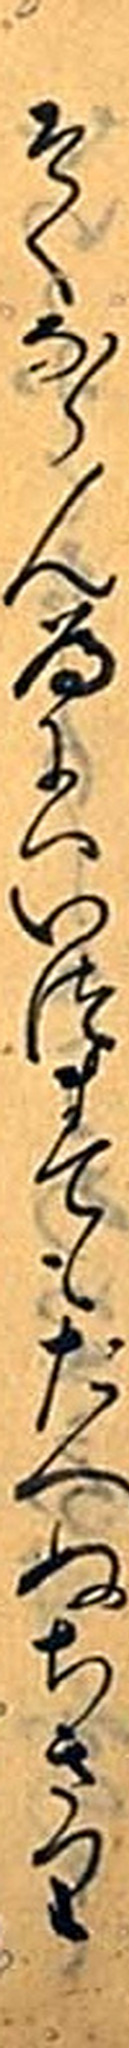そくならん為にはいつまてもたへぬちきり
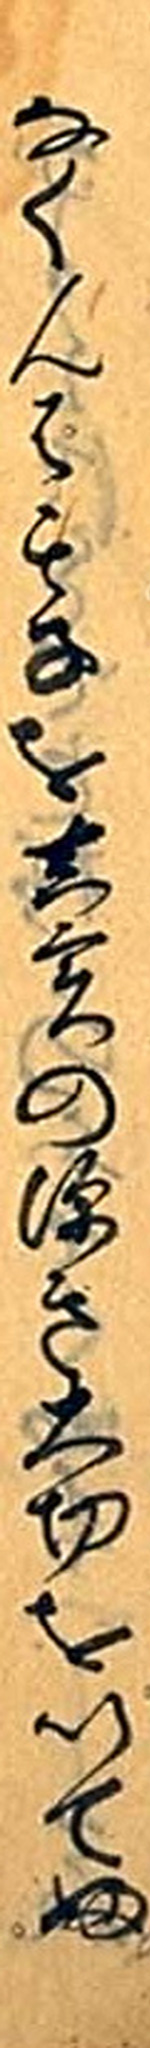なくんは其子を真実の深き大切を以てふ
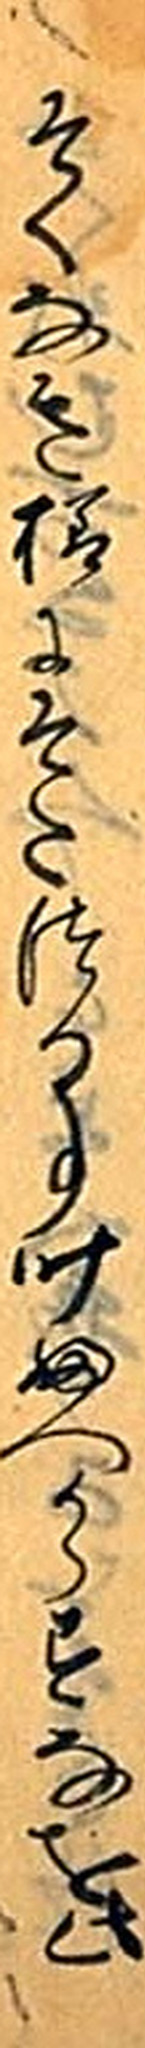そくなき様にそたつる事叶ふへからすなを此
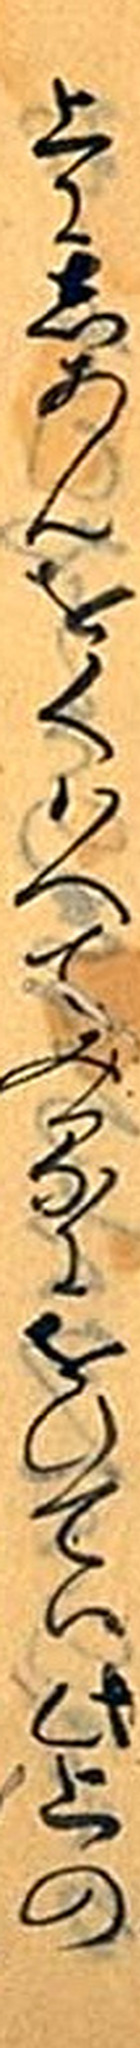上にしあんをくはへてみるにをひては此上の
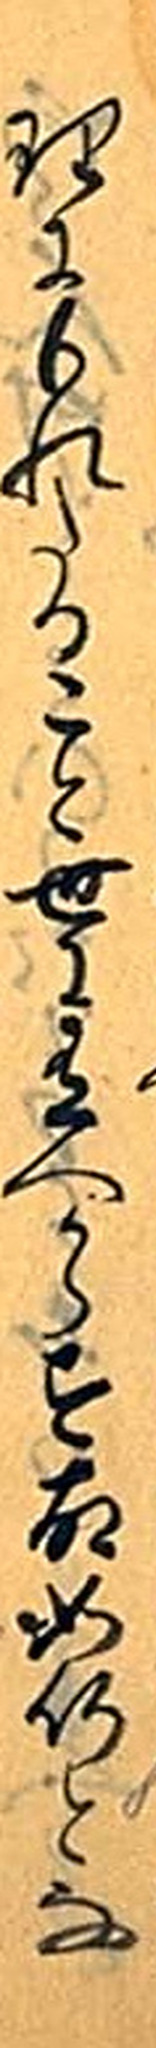理にもれたること世に有へからす故如何とな
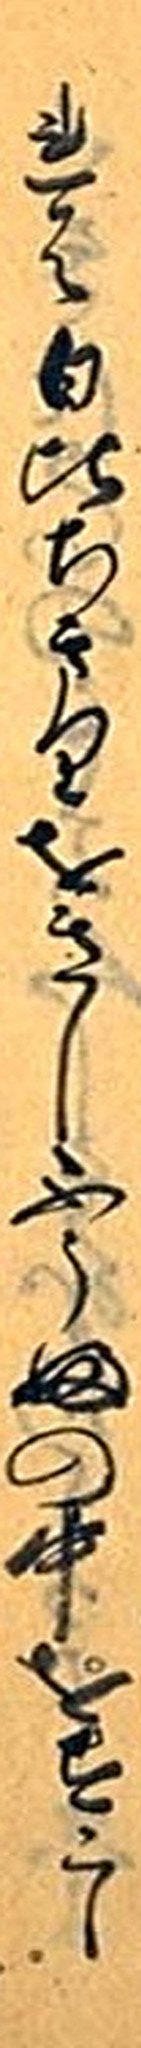れは日比ちきりををきしふう婦の中をすこし
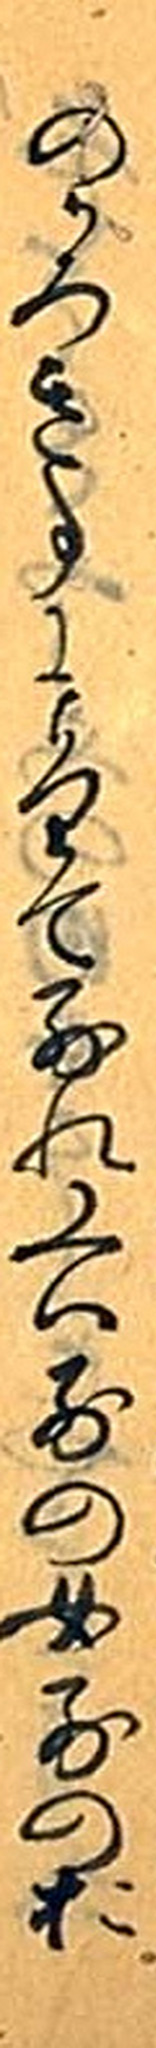のかろき事によりて別れ又は別の女別のお
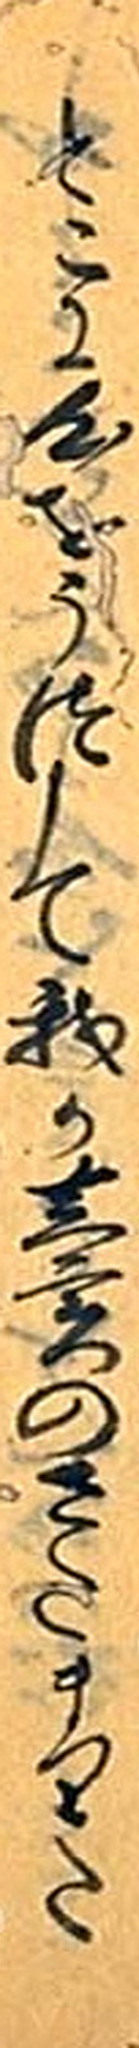とこに心をうつして我か真実のさたまりた
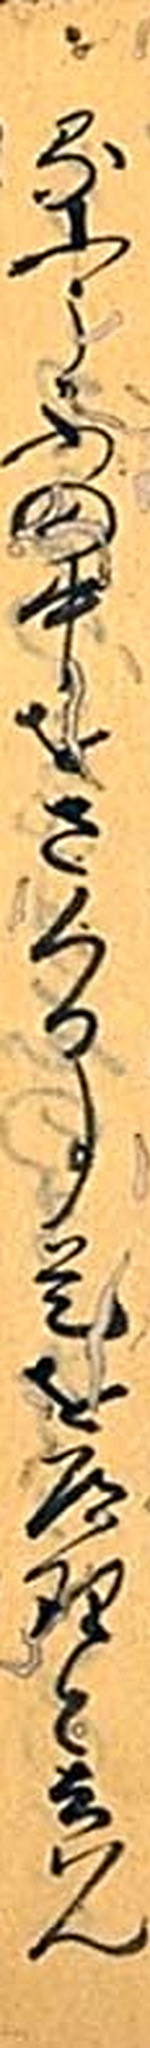るふうふの中をさくる事是を道理と云はん
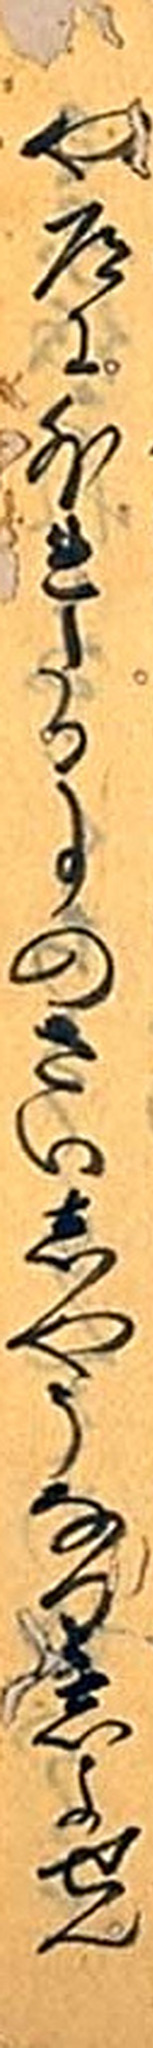や道に外れたる事のさいしやうなりしよせん
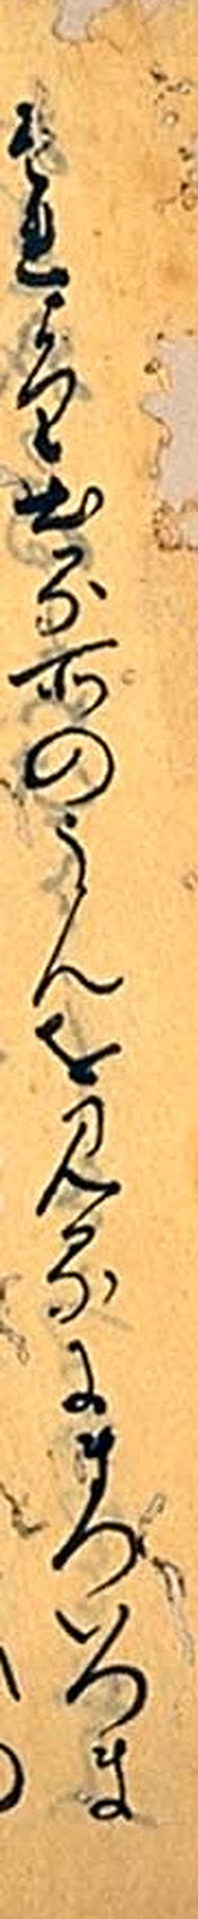それより出る所のうんを見るにまついつま
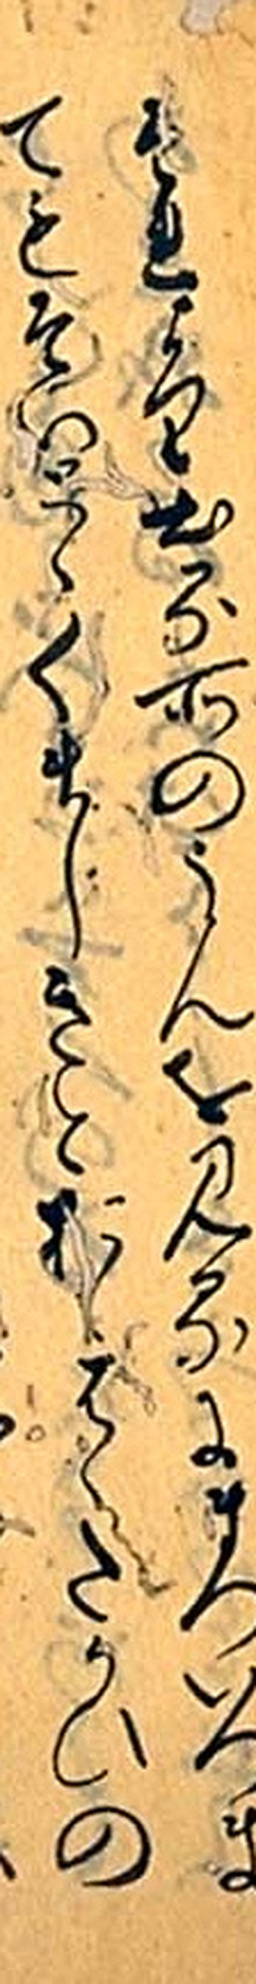てもそいとゝくましきとおはゝたかひの
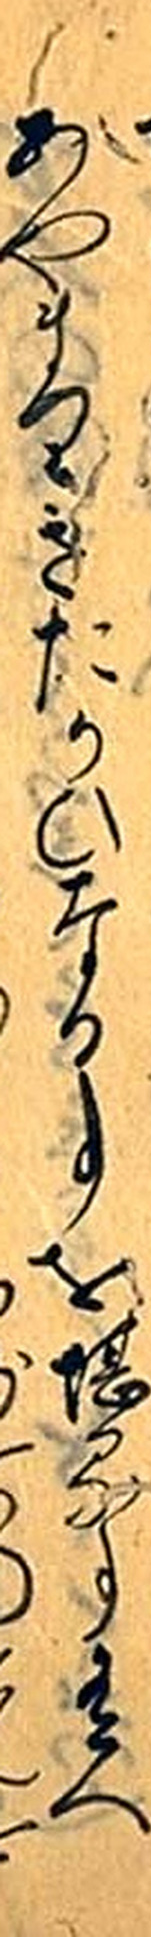あやまりきたかひなる事を堪る事有へ
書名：ドチリナ・キリシタン
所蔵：東京大学総合図書館 / General Library in the University of Tokyo
